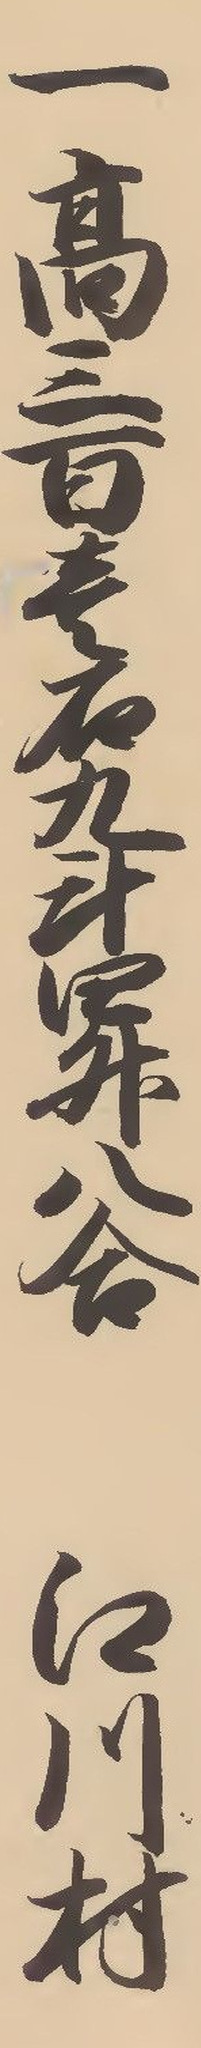一高三百壱石九斗四升八合江川村
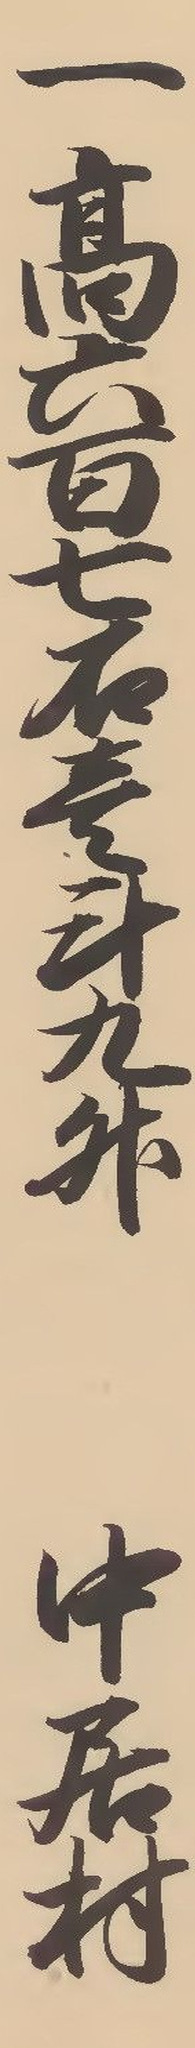一高六百七石壱斗九升中居村
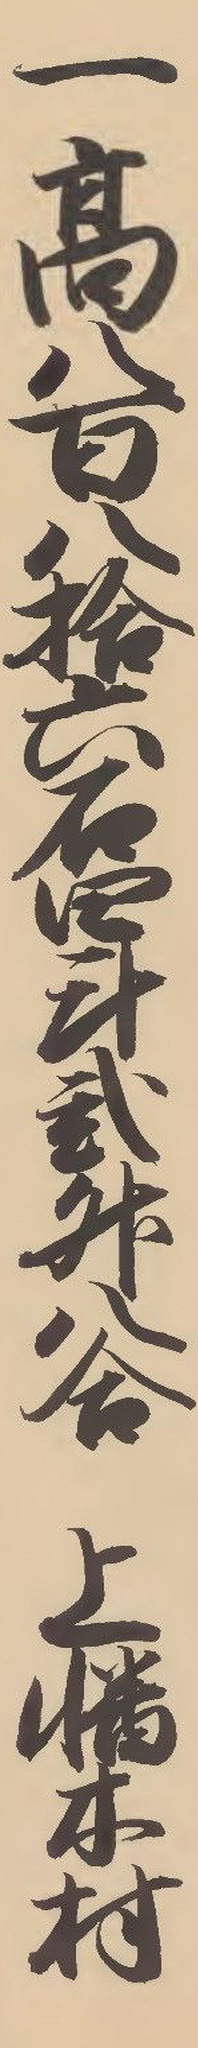一高八百八拾六石四斗弐升八合上幡木村
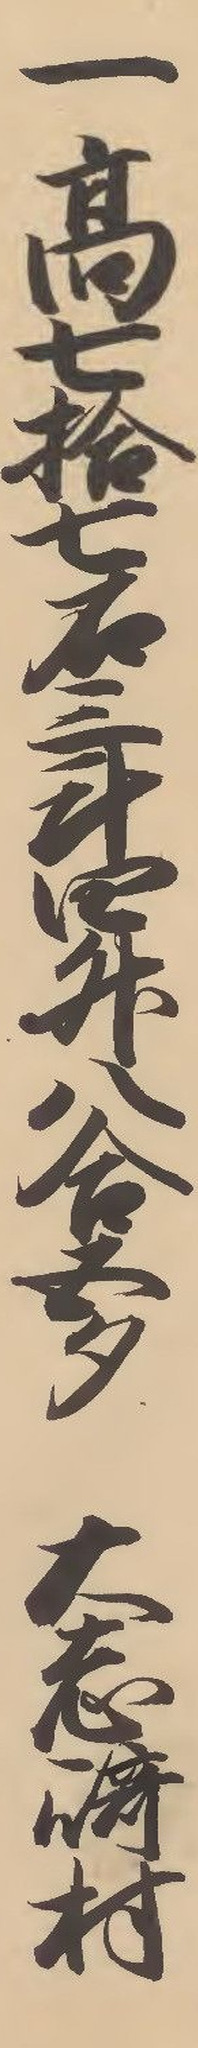一高七拾七石三斗四升八合五勺大志崎村
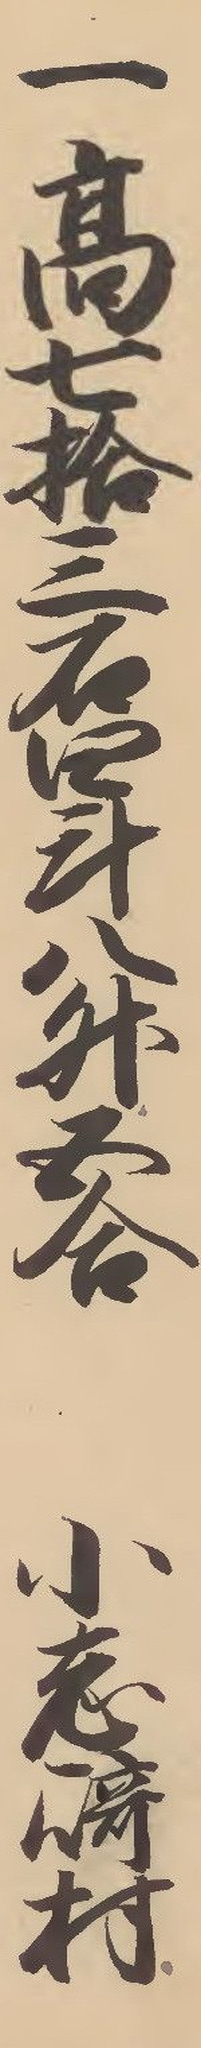一高七拾三石四斗八升五合小志崎村
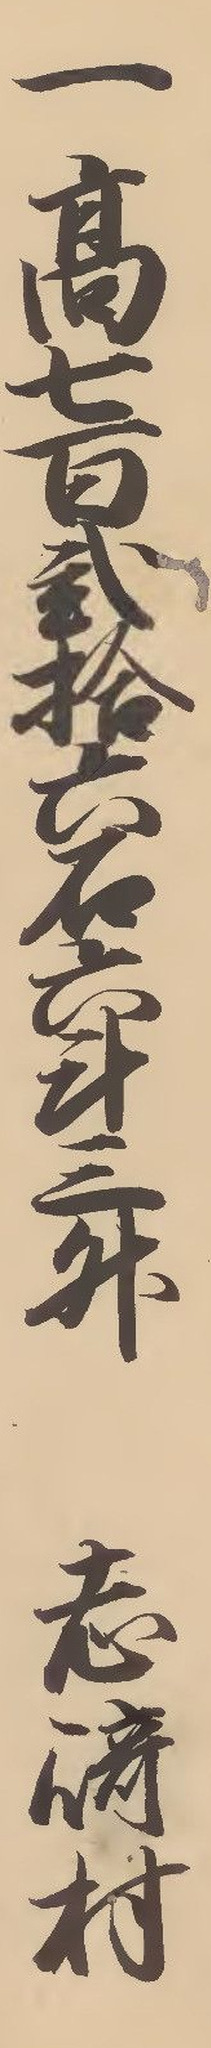一高七百弐拾六石六斗三升志崎村
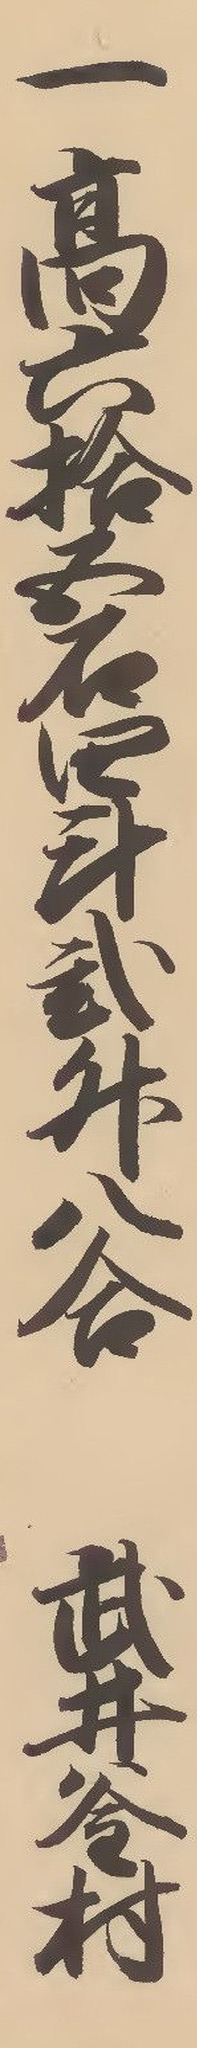一高六拾五石四斗弐升八合武井釜村

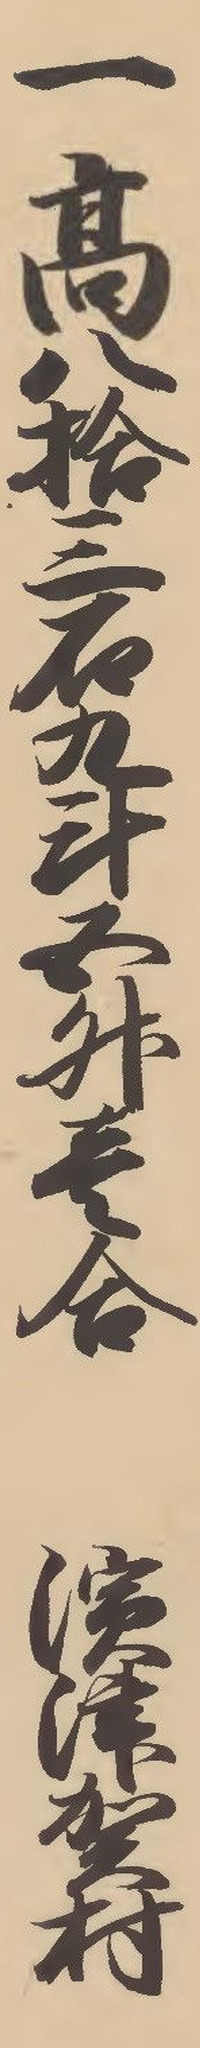一高八拾三石九斗五升壱合浜津賀村
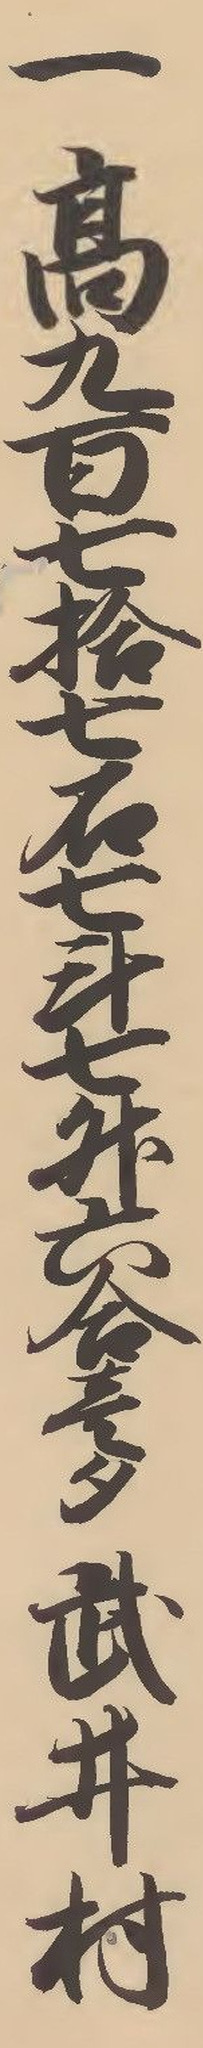一高九百七拾七石七斗七升六合壱勺武井村
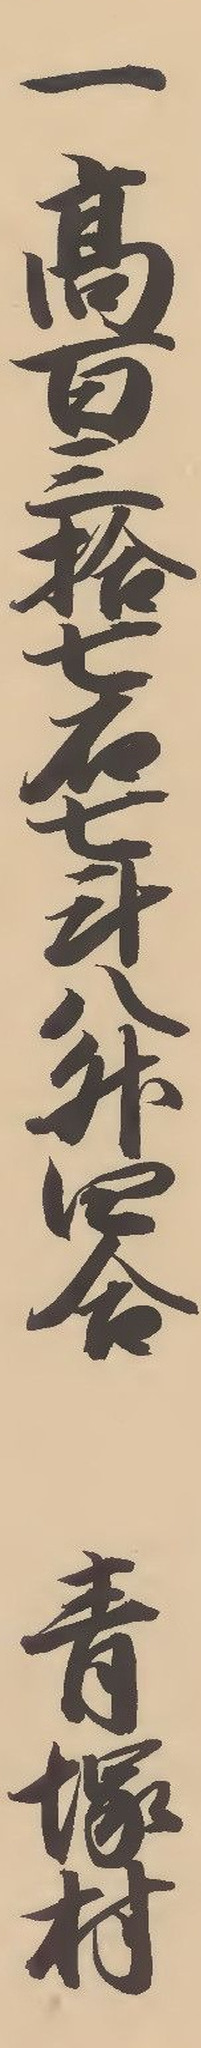一高百三拾七石七斗八升四合青塚村
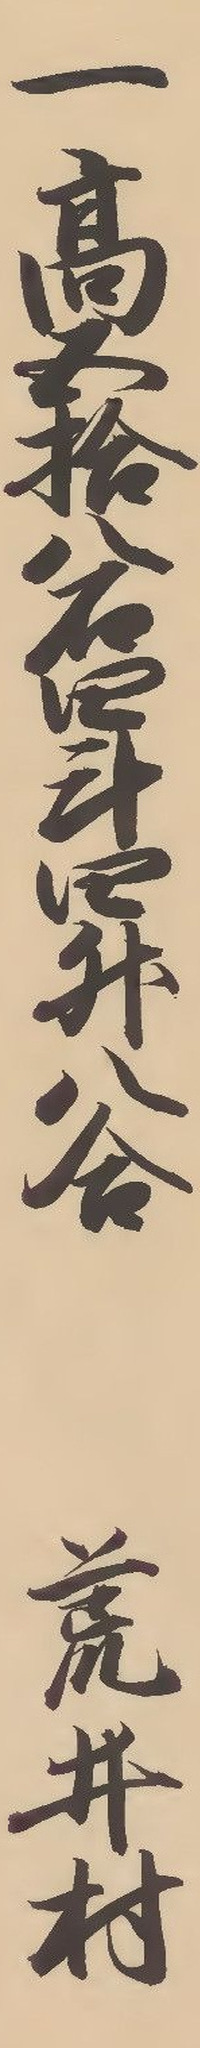一高五拾八石四斗四升八合荒井村
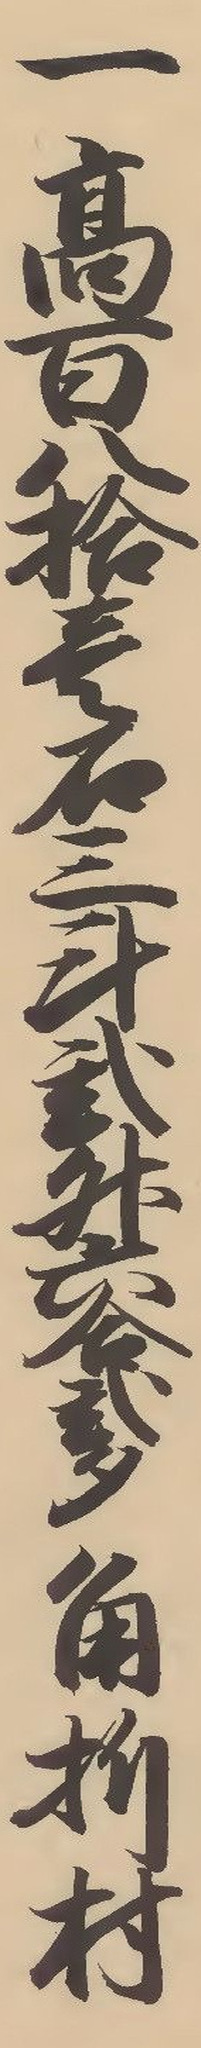一高百八拾壱石三斗弐升六合弐勺角折村
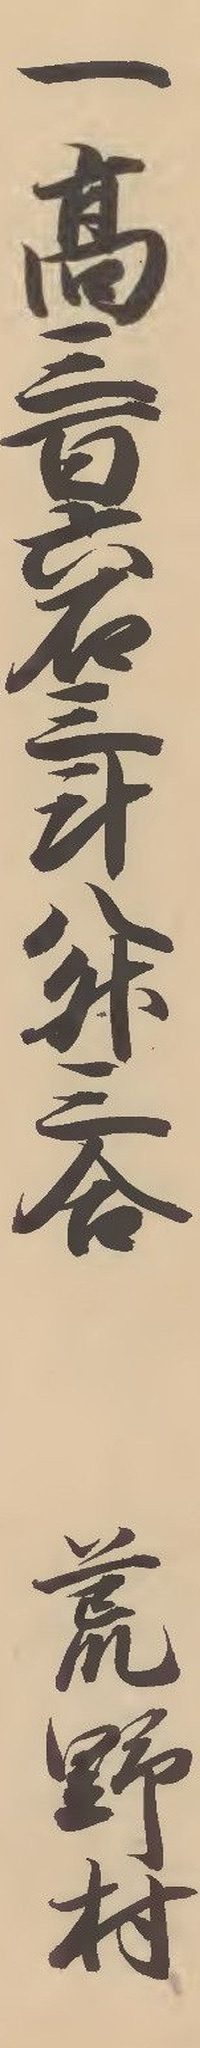一高三百六石三斗八升三合荒野村
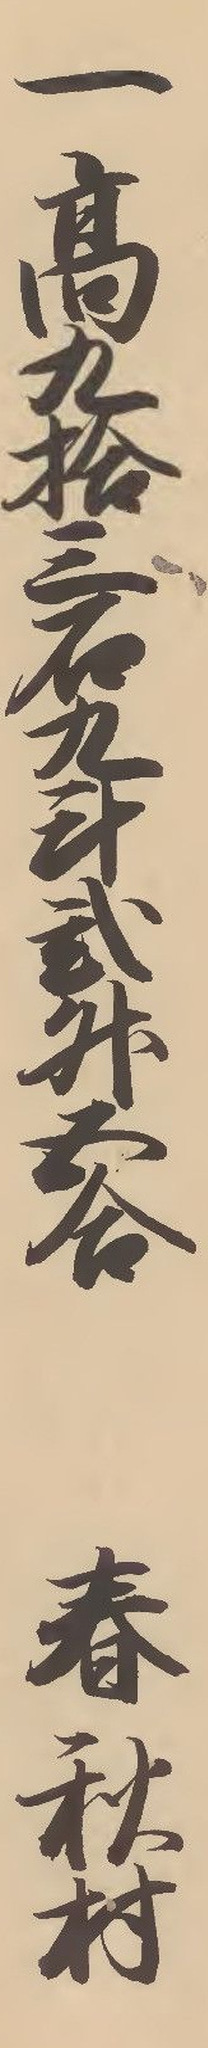一高九拾三石九斗弐升五合春秋村
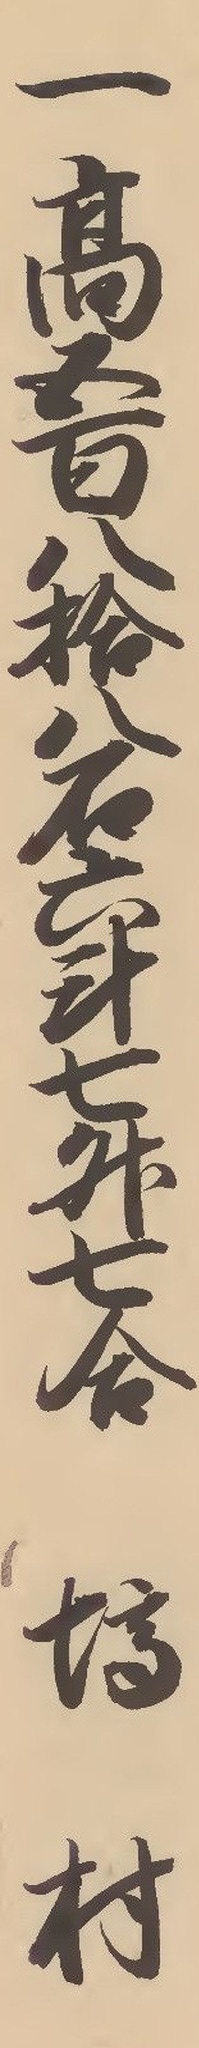一高五百八拾八石六斗七升七合塙村

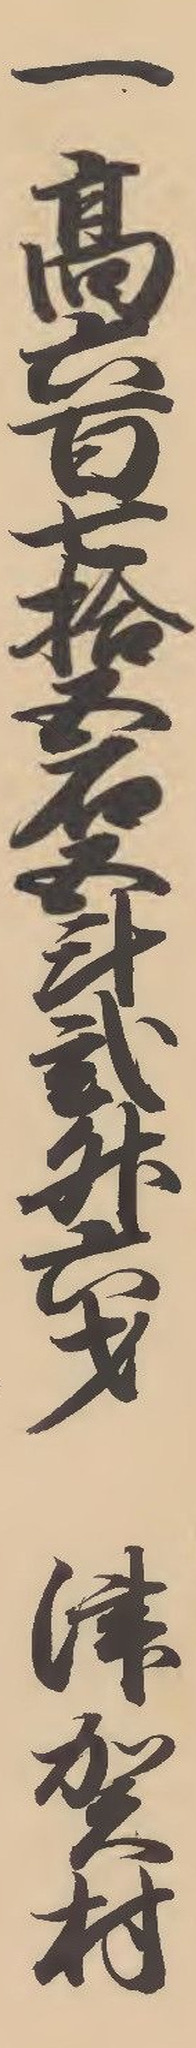一高六百七拾五石五斗弐升六才津賀村
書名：常陸国郷帳
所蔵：国立公文書館 National Archives of Japan
